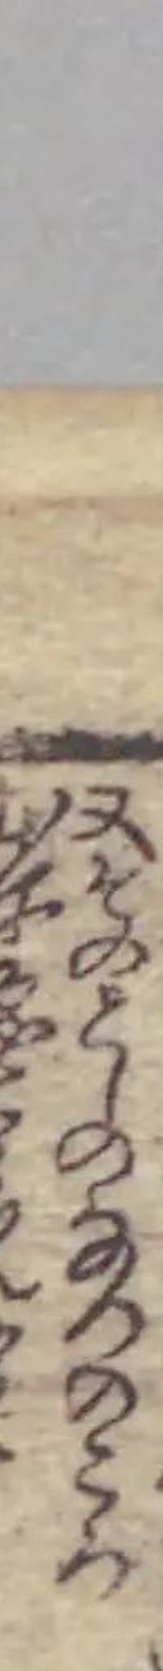又そのとしのなつころ
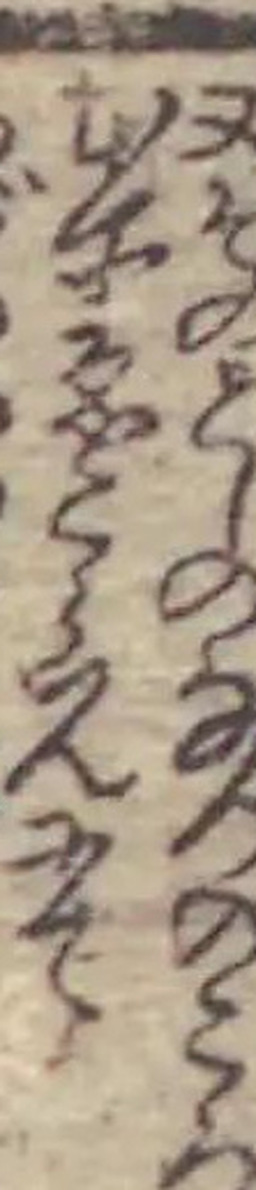本所ゑこういんにて
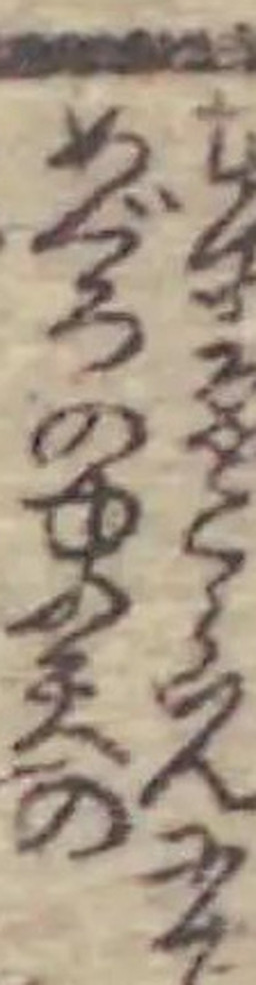めぐろのゆふ天の
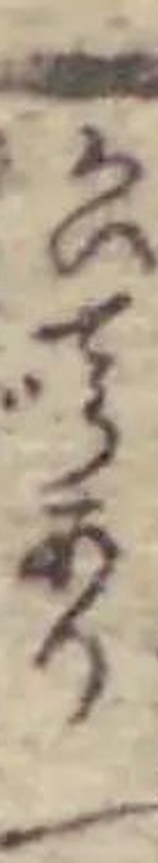かいてうあり
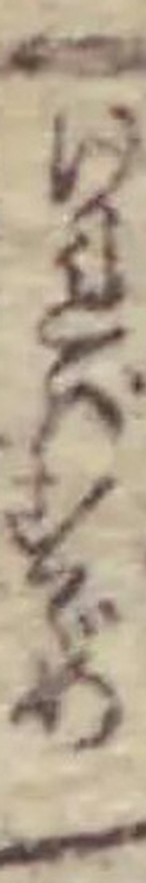ければすゞめ
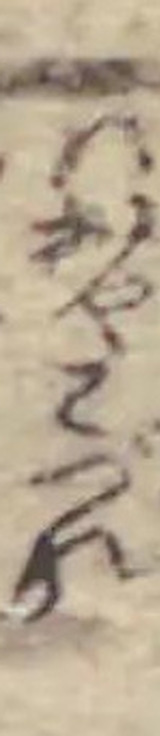はおやこづれ
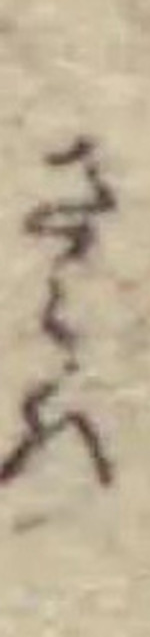さらは
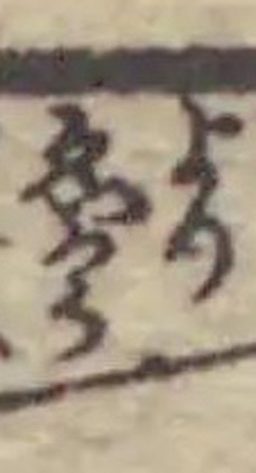ゑかう
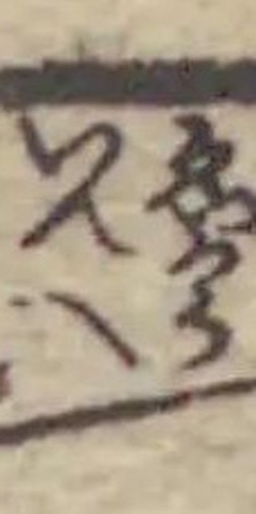いんへ
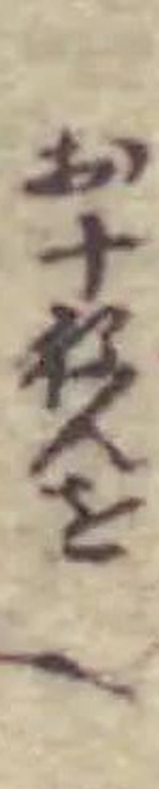お十ねんを
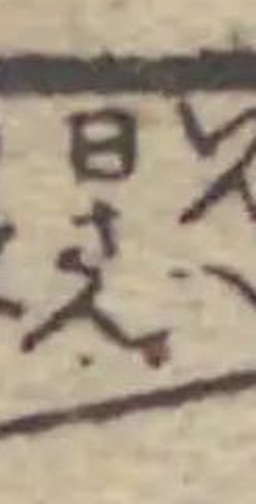日さん
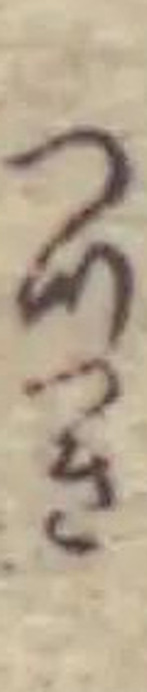つつつき
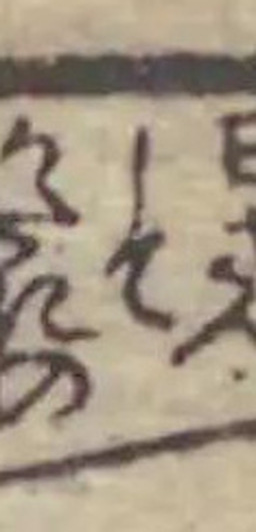かたきの
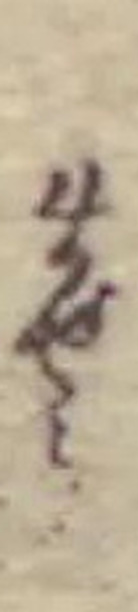ませう
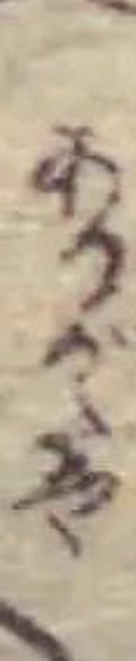ありがたや
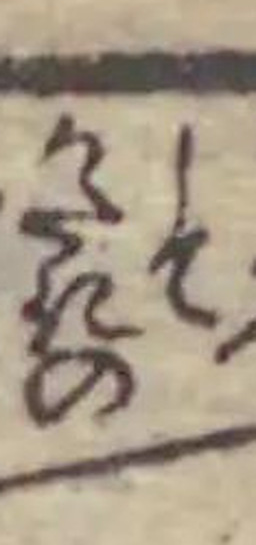かたきの
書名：冷水灰毛猫 2巻
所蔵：国立国会図書館 National Diet Library, JAPAN
